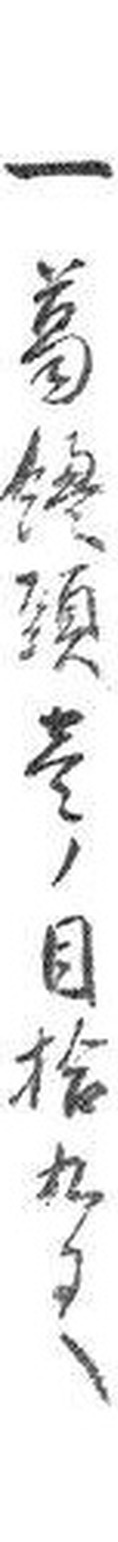一葛饅頭壱ノ目拾九匁
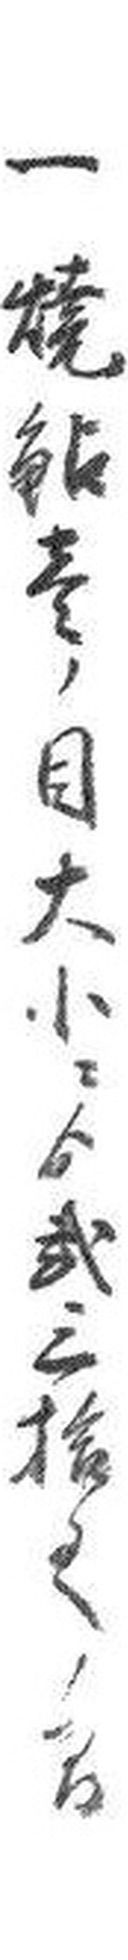一焼鮎壱ノ目大小ニゟ弐三拾匁ノ間
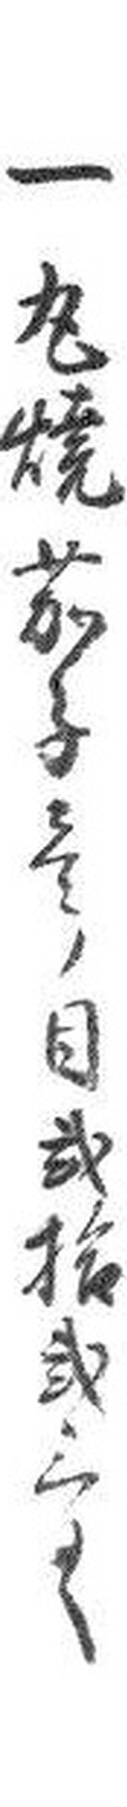一丸焼茄子壱ノ目弐拾弐三匁
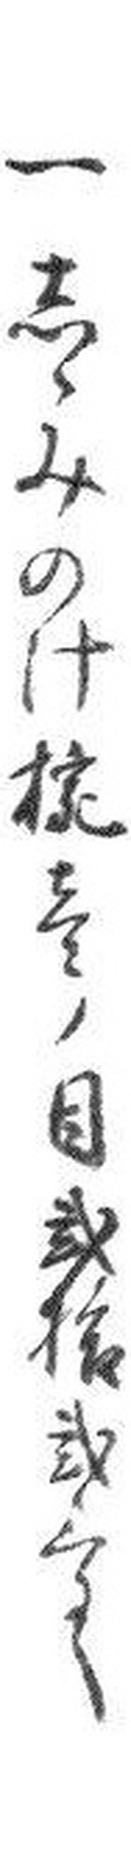一しゝみの汁椀壱ノ目弐拾弐三匁
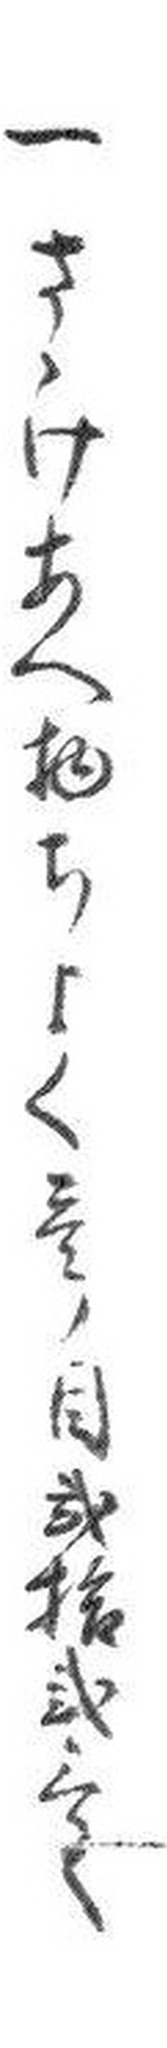一さゝけあへ物ちよく壱ノ目弐拾弐三匁
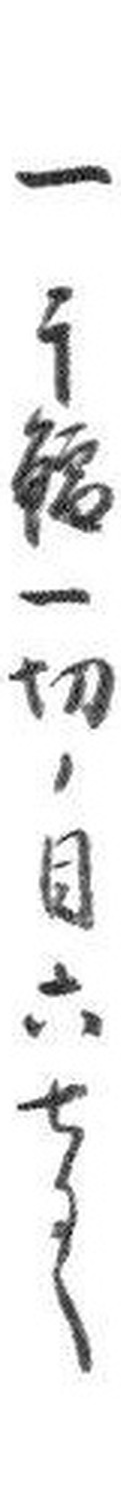一干鱈一切ノ目六七匁
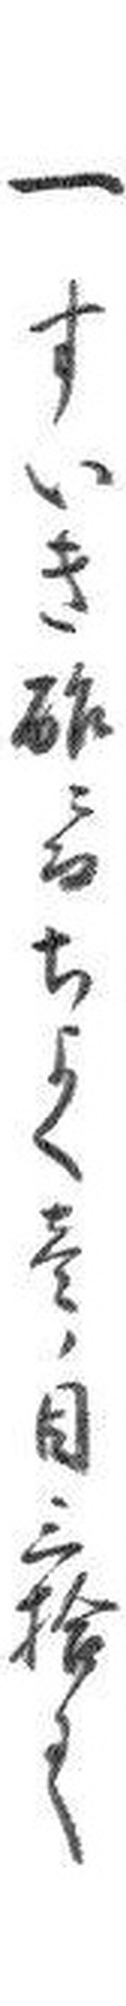一すいき酢ニ而ちよく壱ノ目三拾匁
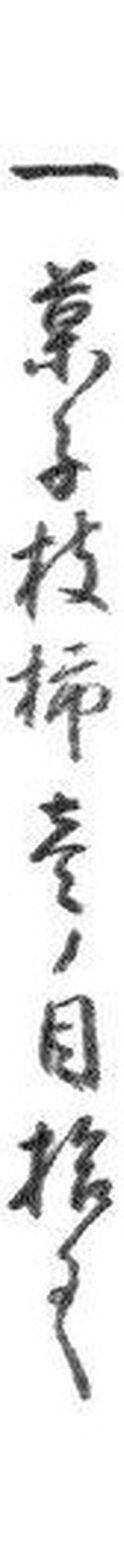一菓子枝柿壱ノ目拾匁
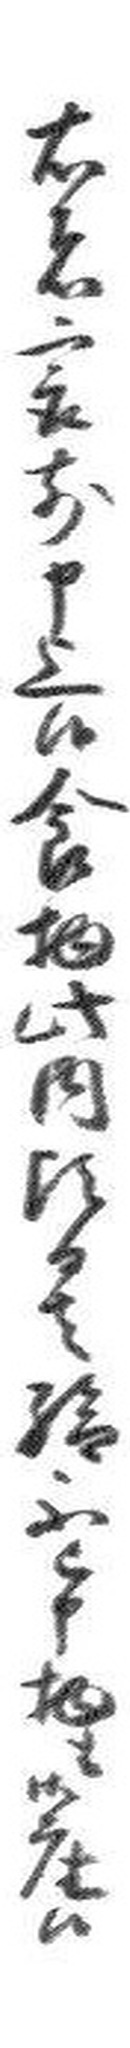右者最前申上候食物此内頃日は給不被申物も御座候
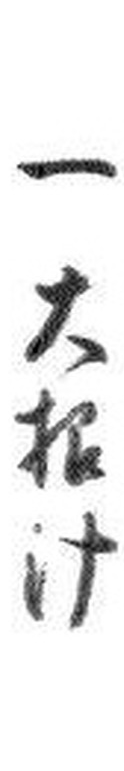一大根汁
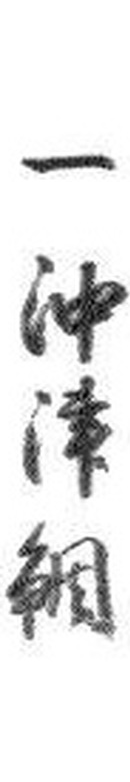一沖津鯛
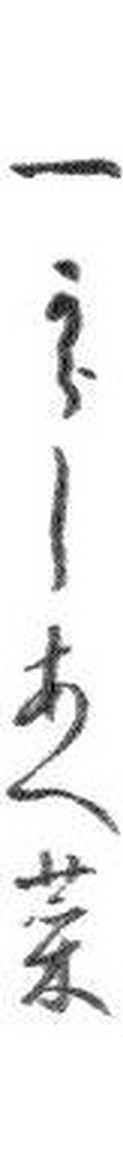一からしあへ菜
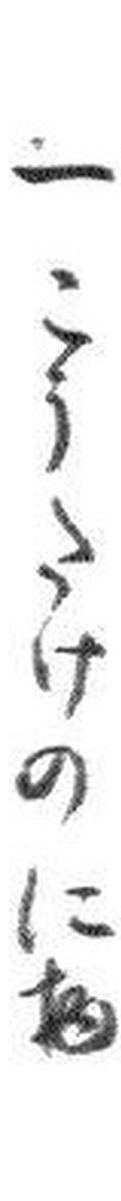一こうたけのに物
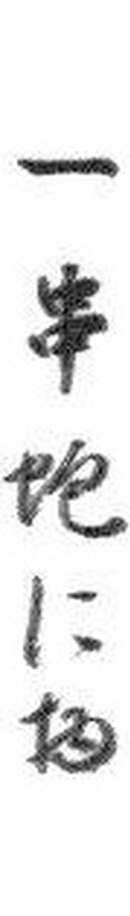一串蚫に物
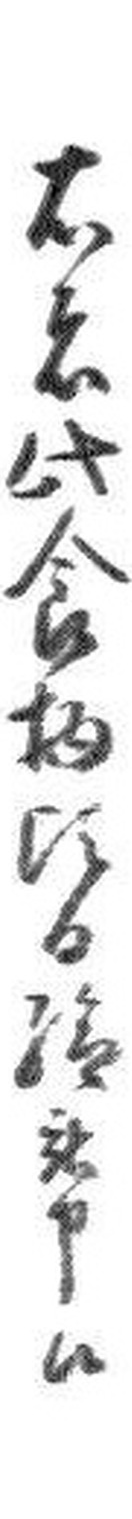右者此食物頃日給被申候

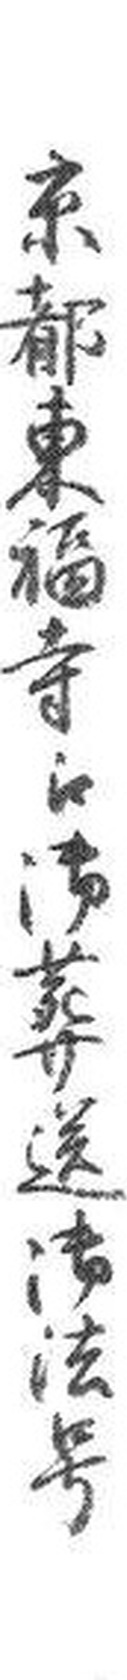京都東福寺江御葬送御法号
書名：家譜 八 光通公 従寛文十年到同十二年
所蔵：福井県文書館 Fukui Prefectural Archives
